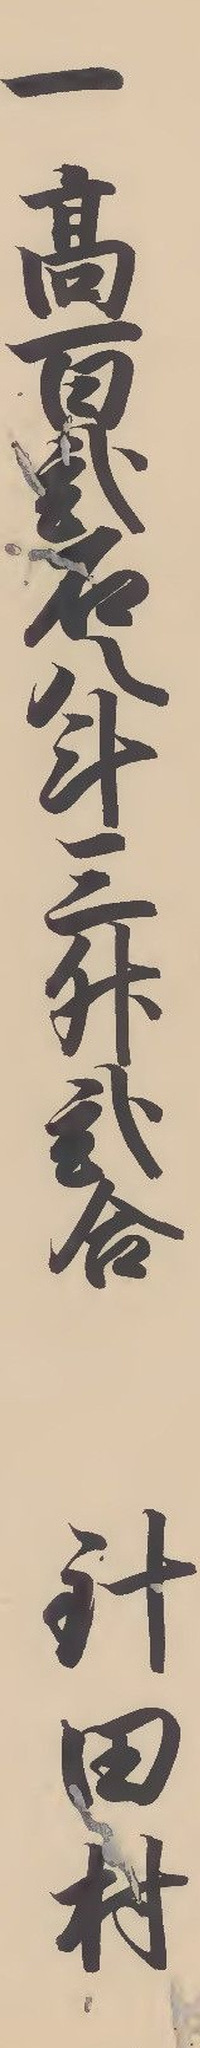一高百弐石八斗三升弐合針田村
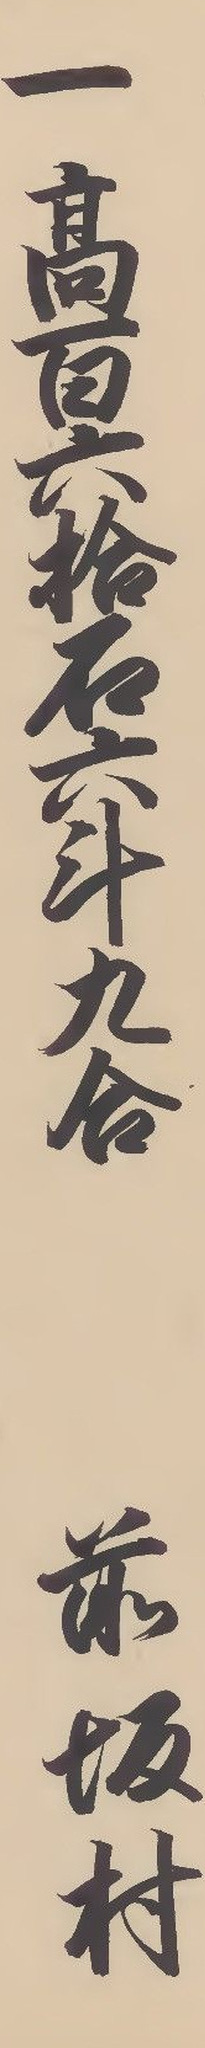一高百六拾石六斗九合前坂村
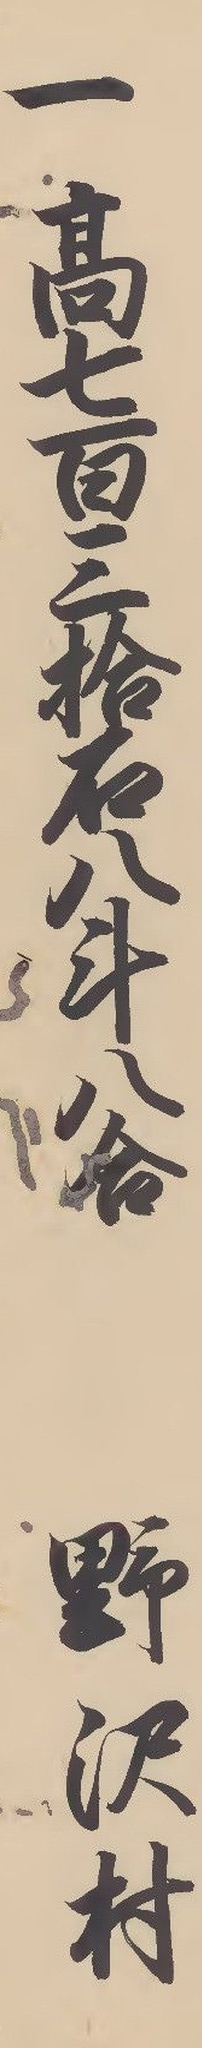一高七百三拾石八斗八合野沢村

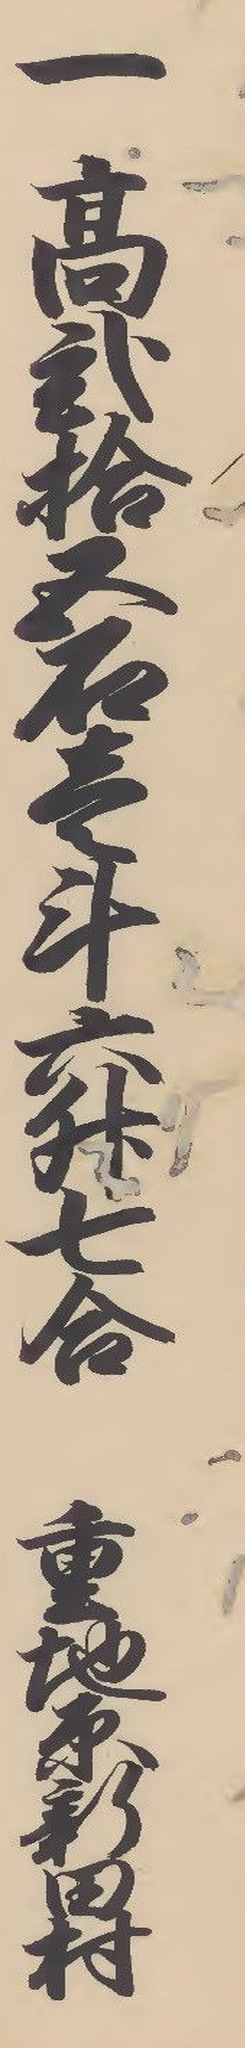一高弐拾五石壱斗六升七合重地原新田村
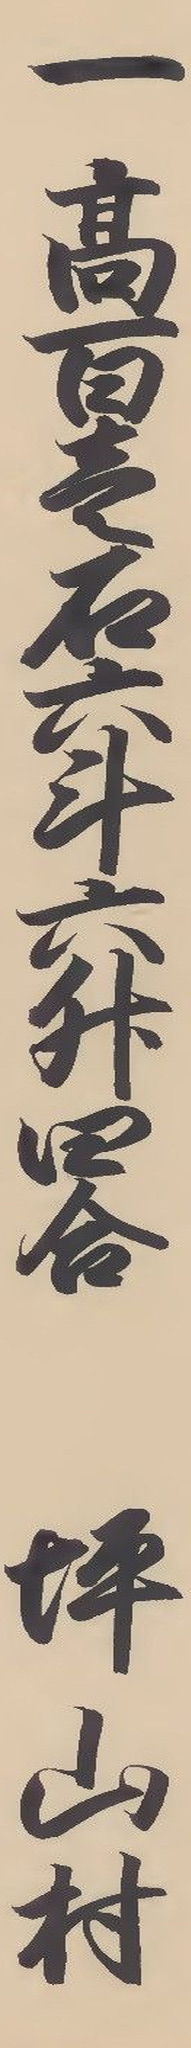一高百壱石六斗六升四合坪山村
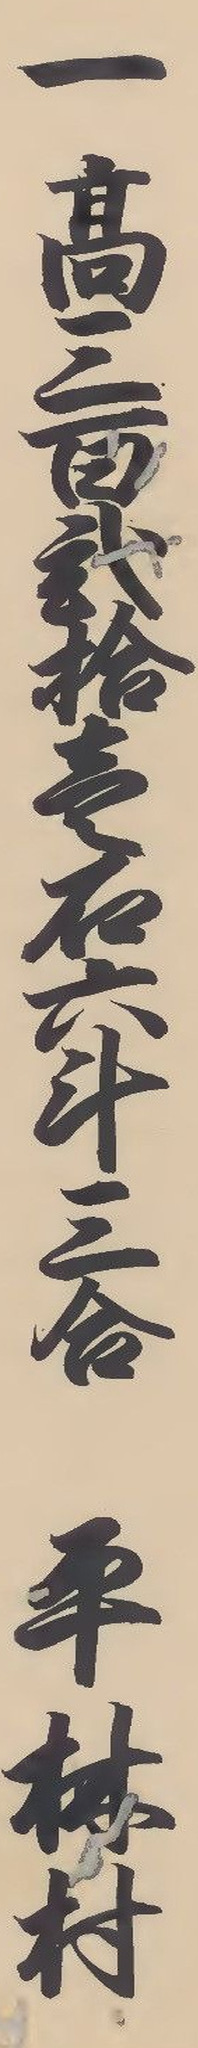一高三百弐拾壱石六斗三合平林村
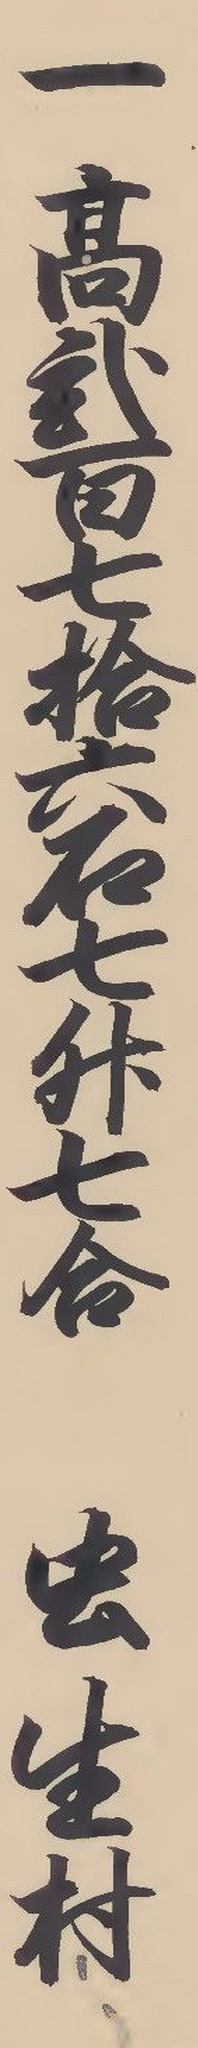一高弐百七拾六石七升七合虫生村
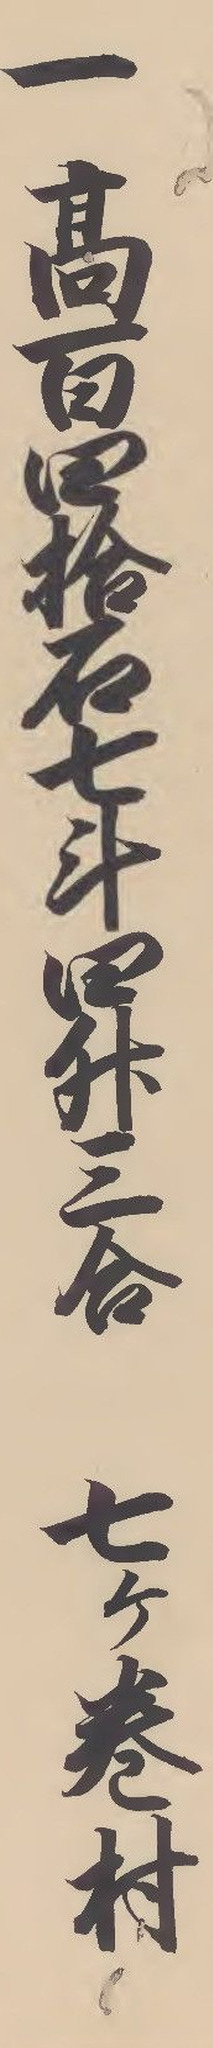一高百四拾石七斗四升三合七ヶ巻村
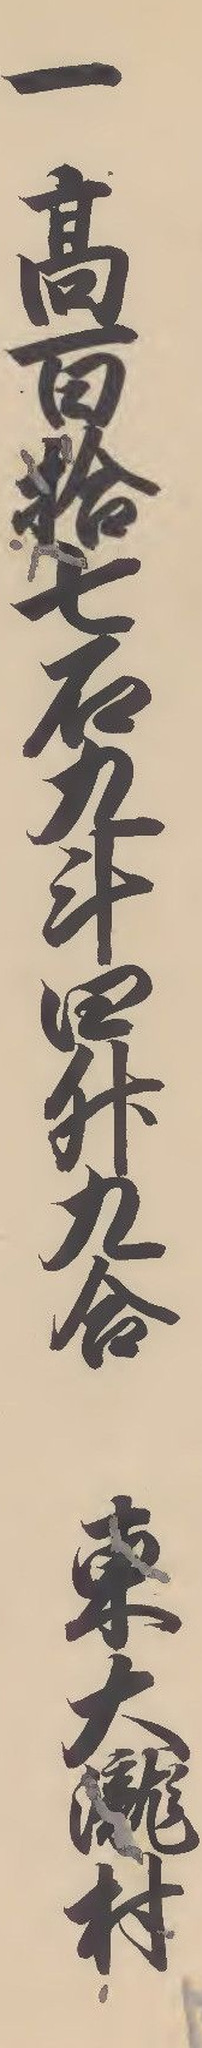一高百拾七石九斗四升九合東大滝村
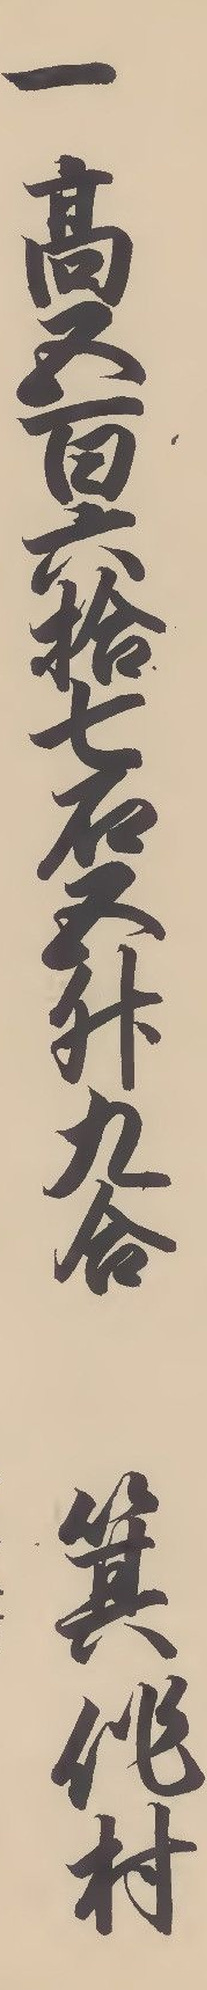一高五百六拾七石五升九合箕作村
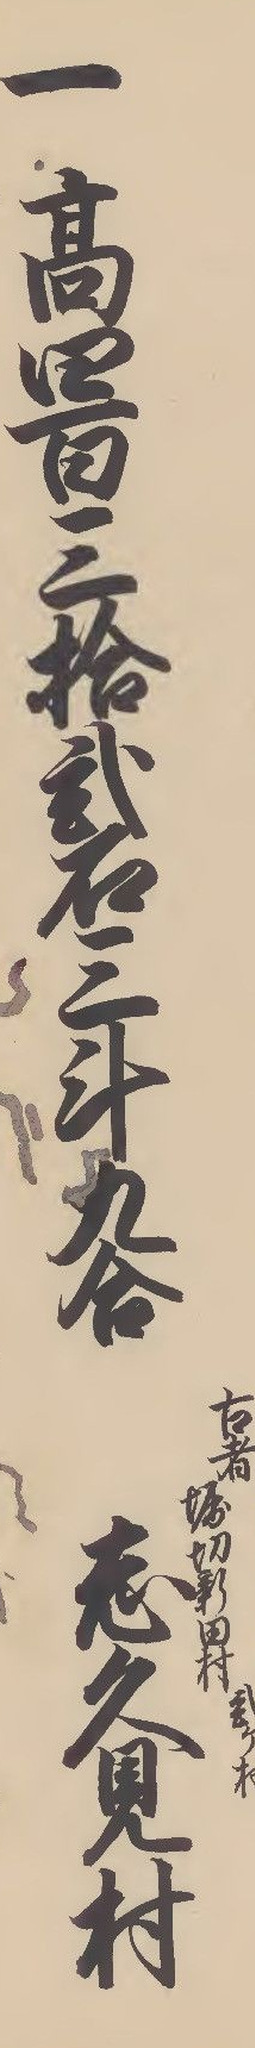一高四百三拾弐石三斗九合志久見村

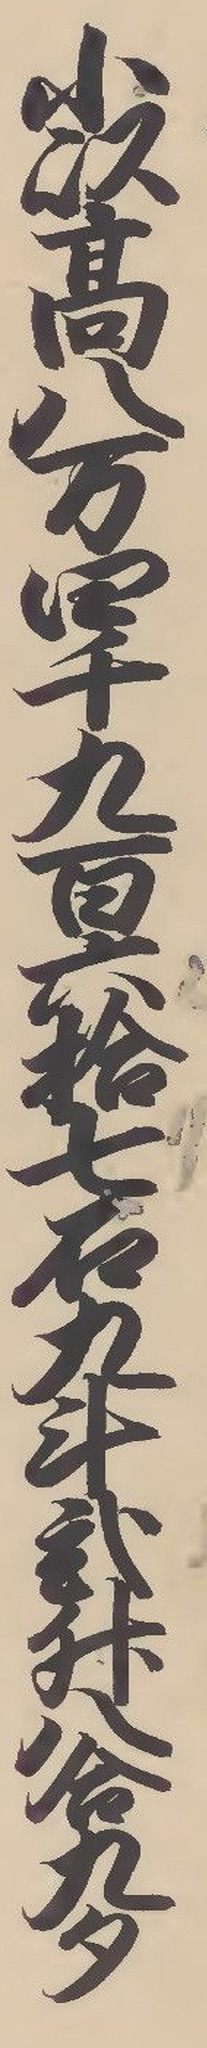小以高八万四千九百六拾七石九斗弐升八合九勺
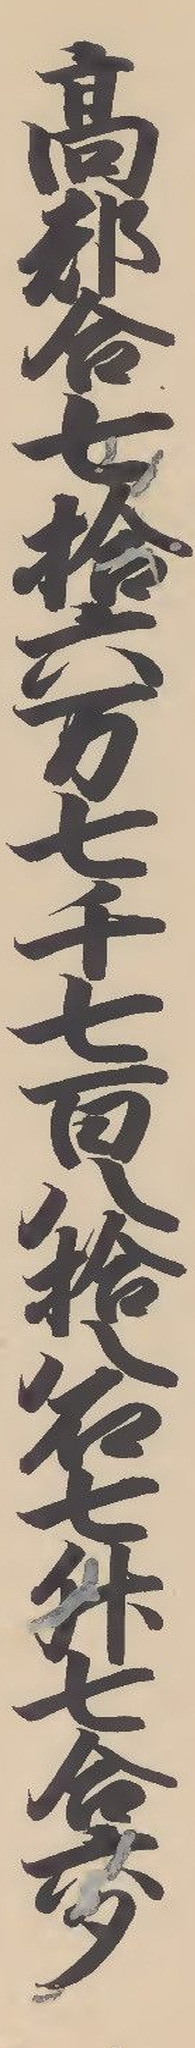高都合七拾六万七千七百八拾八石七升七合六勺
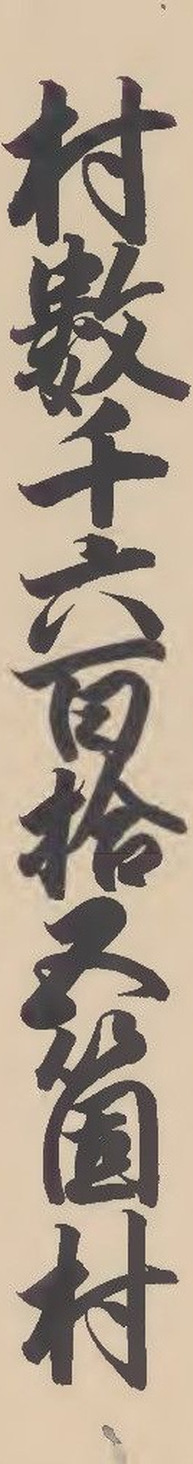村数千六百拾五箇村
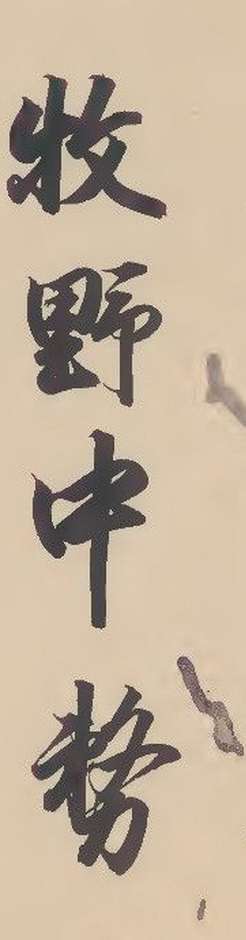牧野中務
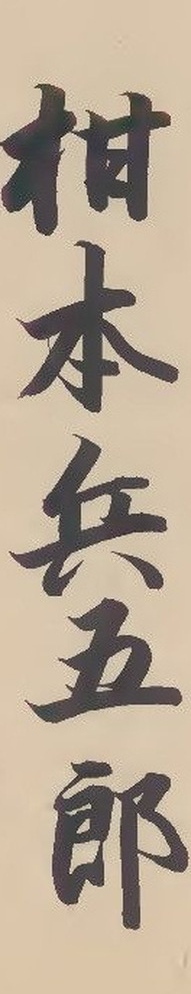柑本兵五郎
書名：信濃国郷帳
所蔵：国立公文書館 National Archives of Japan
